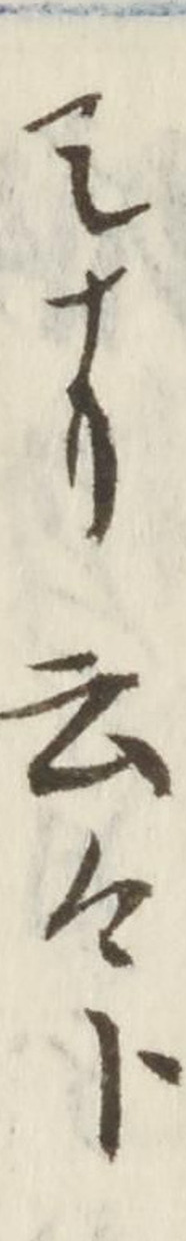しナリ云々ㇳ
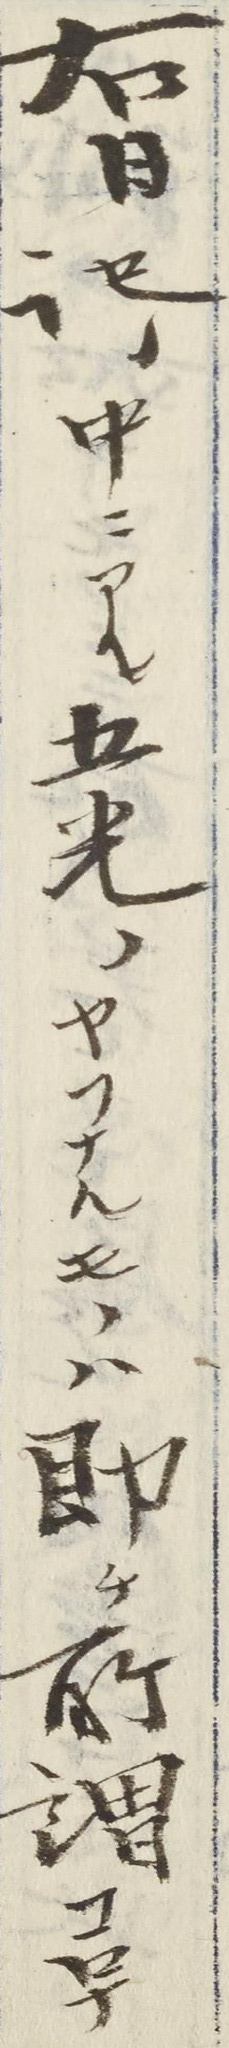右日記ノ中二アル五光ヤフナルモノハ即チ所謂コロナ
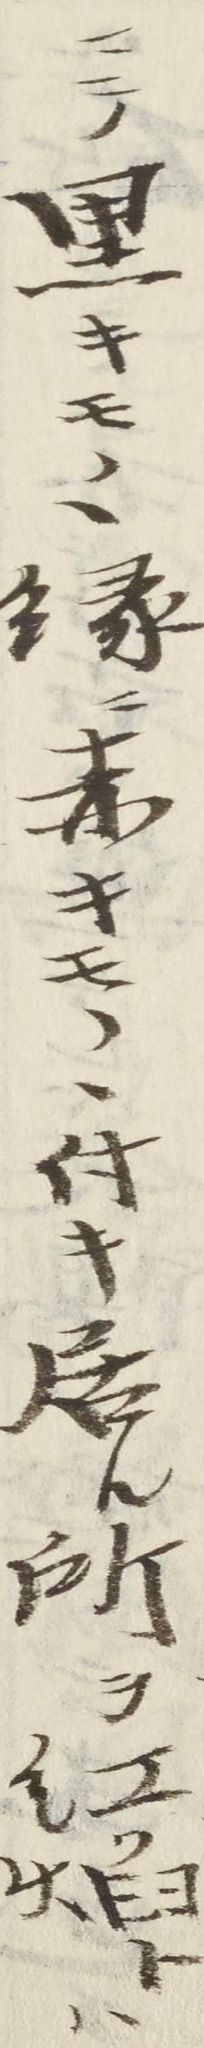ニテ黒キモノゝ縁二赤キモノゝ付キ居ㇽ所ヲ紅焔ㇳハ
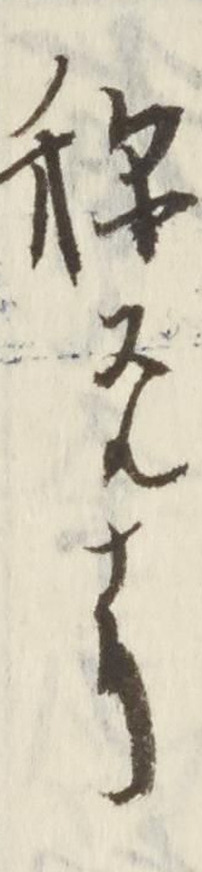称スルナリ
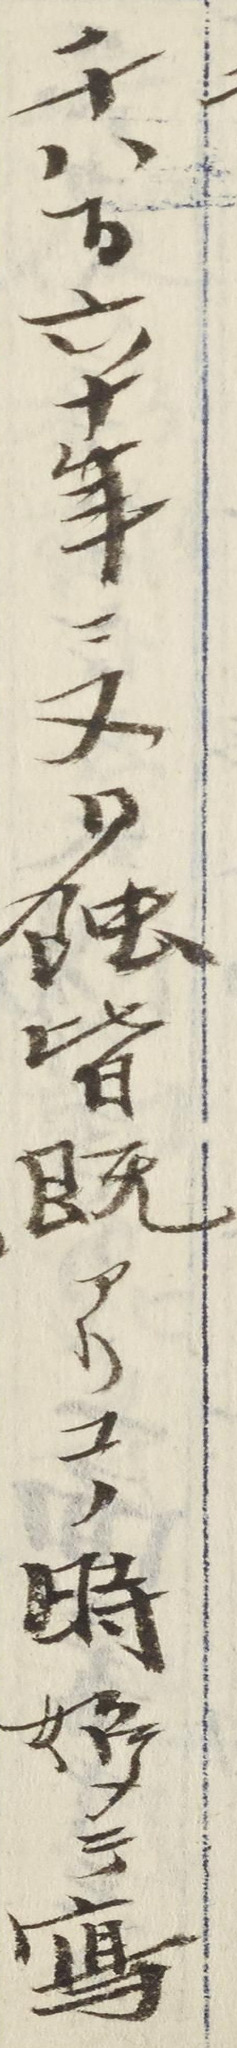千八百六十年二又日蝕皆既アリコノ時始メテ写
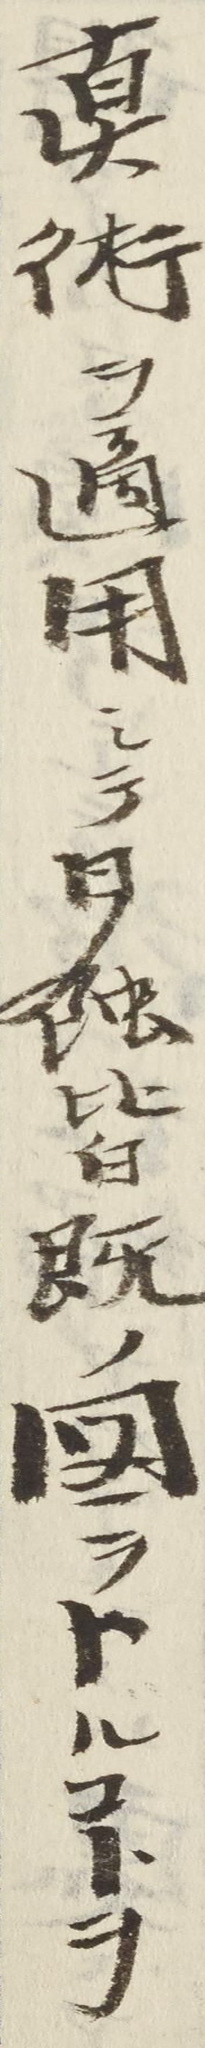真術ヲ通用シテ日蝕皆既ノ図ヲトルコトヲ

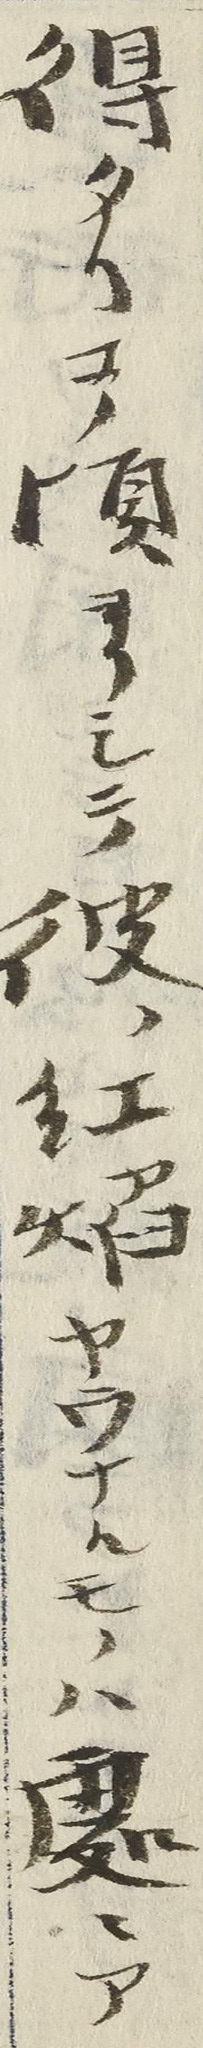得タリコノ頃ヨリシテ彼ノ紅焔ヤウナルモノハ処々二ア
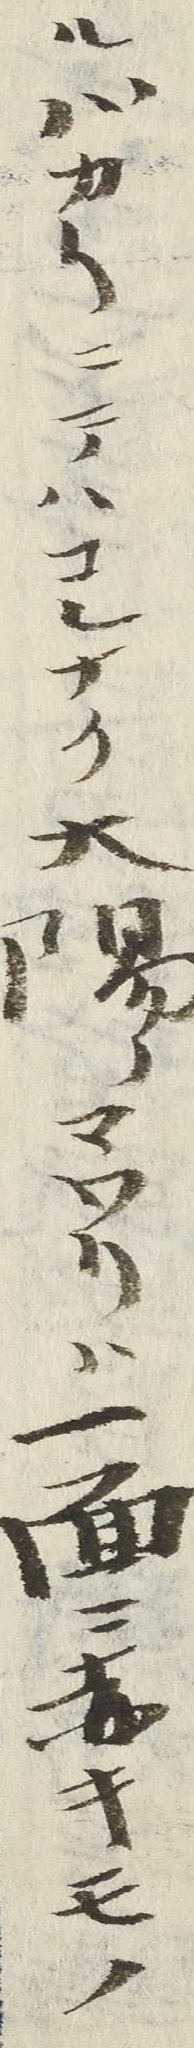ㇽバカリニテハコレナリ太陽ノマワリハ一面二赤キモノ
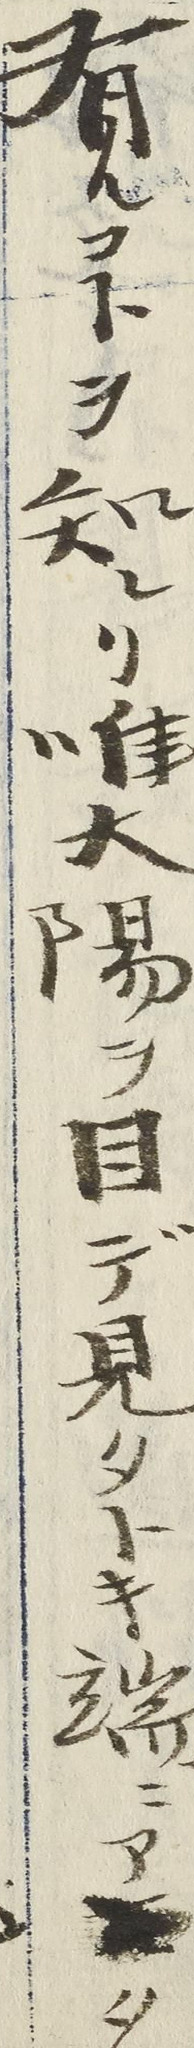有ㇽコトヲ知レリ唯太陽ヲ目デ見タトキ端二アリタ
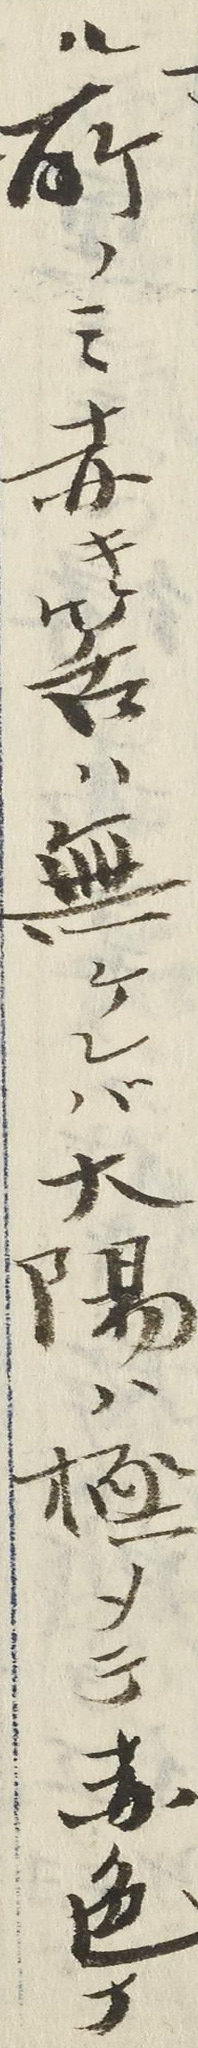ル所ヲミ赤キ筈は無ケレバ太陽ハ極メテ赤色ナ
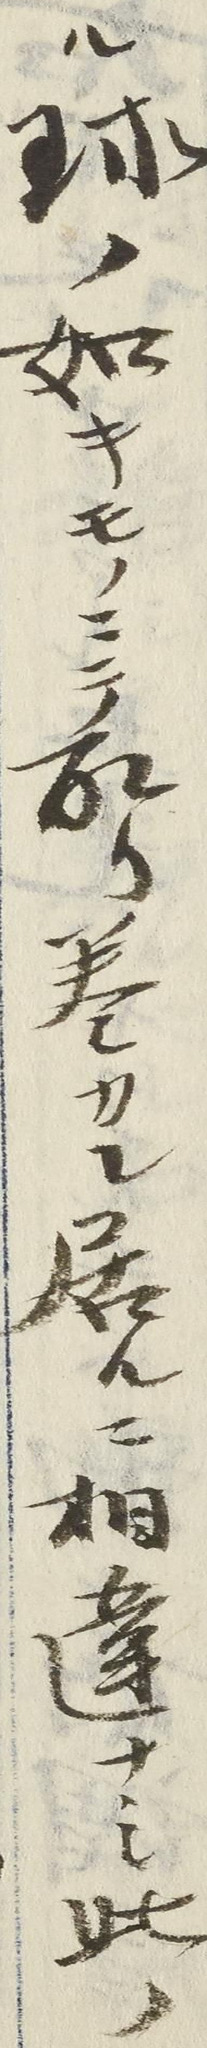ㇽ球ノ如キモノニテ所リ巻カレ居ㇽ二相違ナシ此ノ
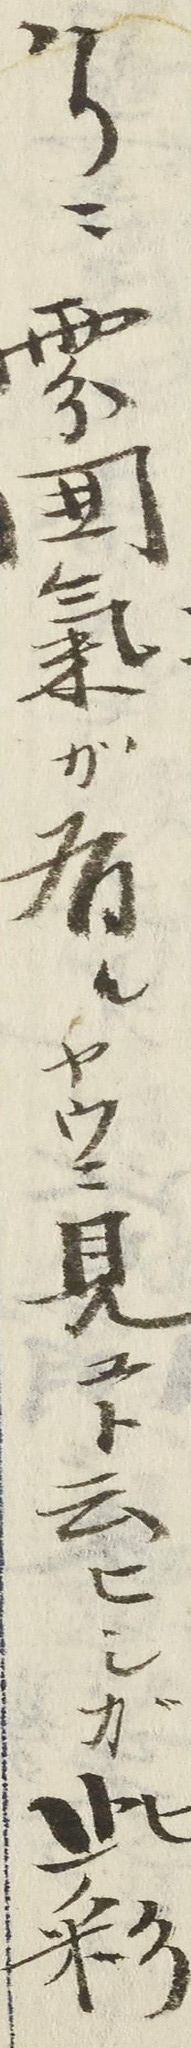ハリ二雰囲気が有ㇽヤウ二見ユㇽ云ヒシヵ此彩
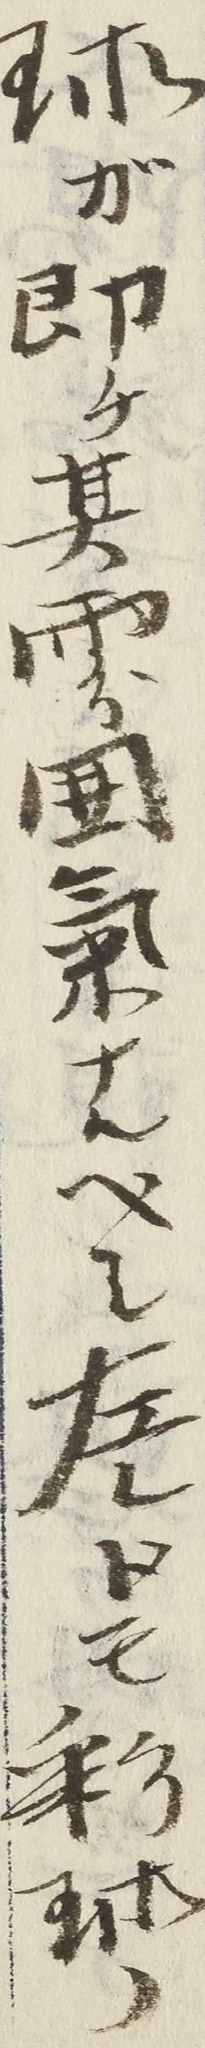球が即チ其雰囲気ナルベシ左レドモ彩球ノ
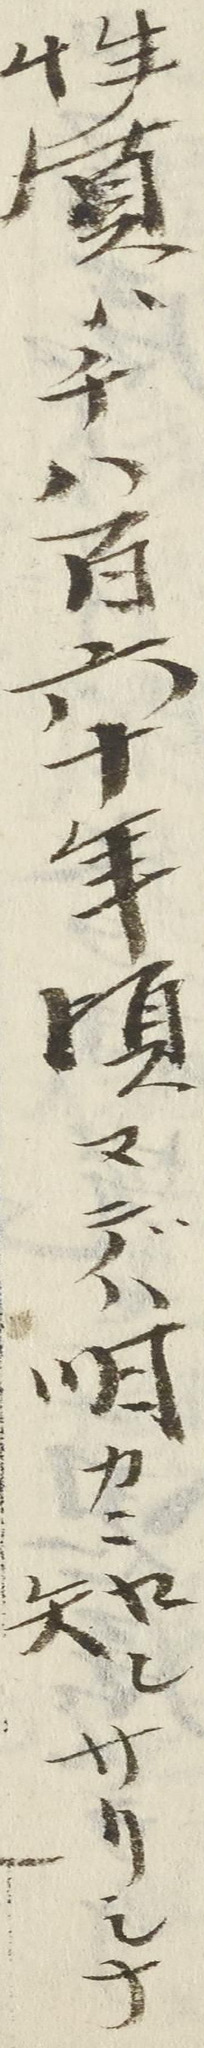性質ハ専八百六十年頃マデハ明カニ知レ去レサリシナ
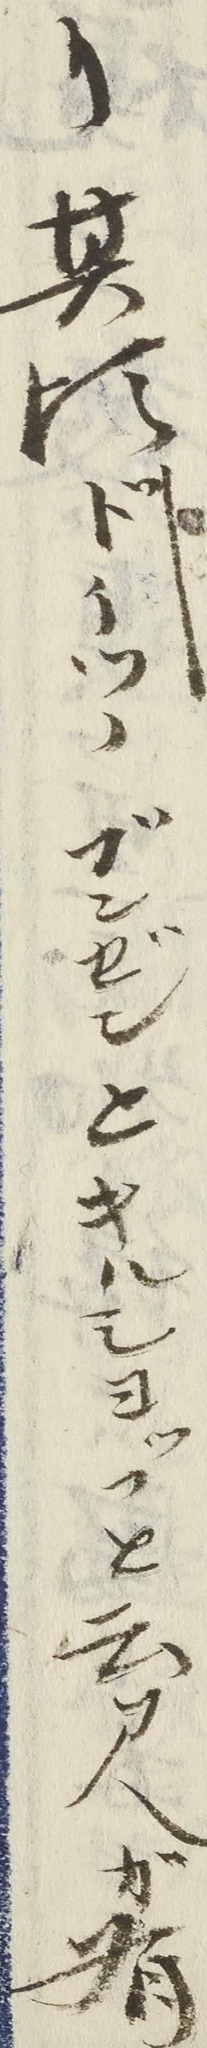リ其頃ドイツノブンゼンとキルシヨツフと云フ人が有
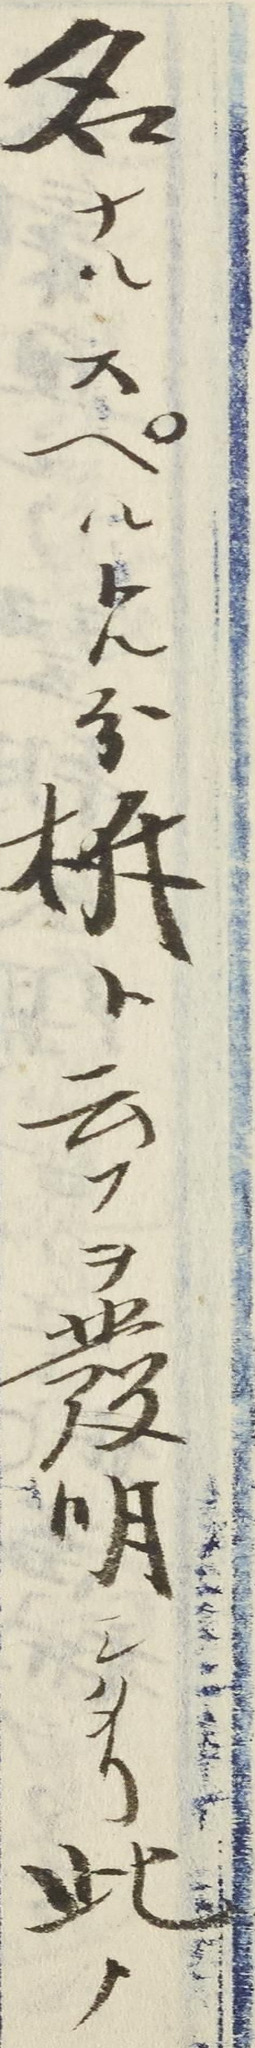名ナルスペルトル分析ト云フヲ発明シタリ此ノ
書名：日蝕録　全
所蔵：東京大学地震研究所図書室 Earthquake Research Institute Library, The University of Tokyo, JAPAN
